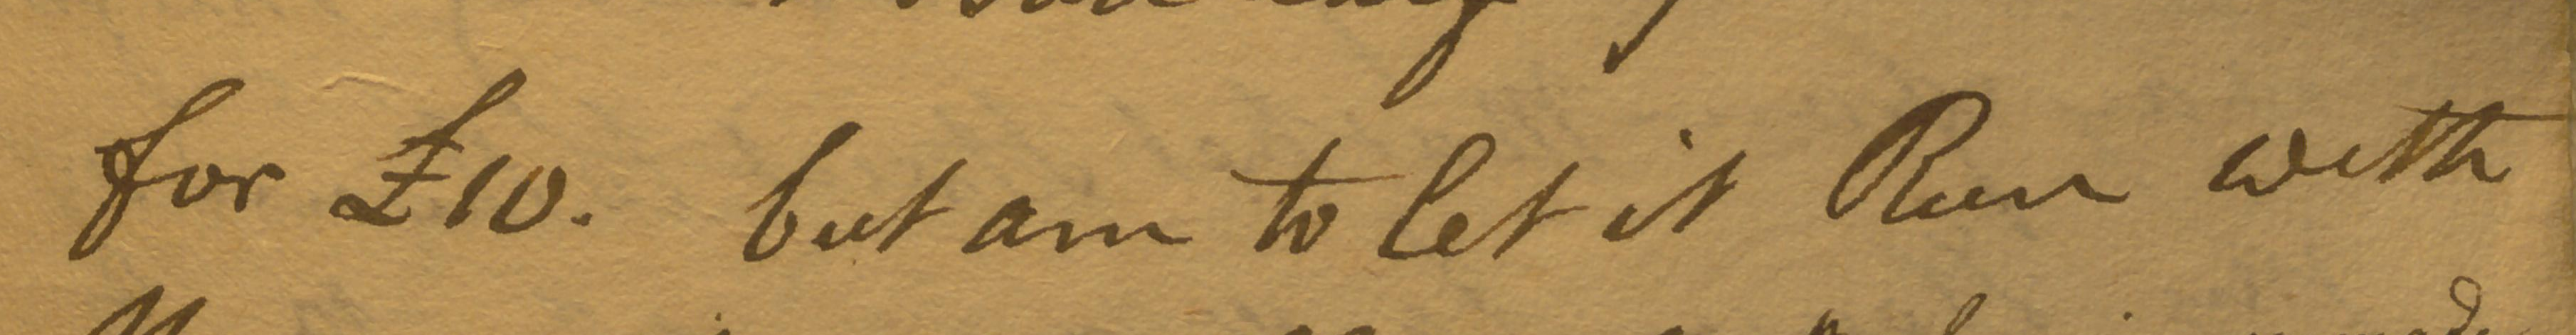for £10. but am to let it Run with
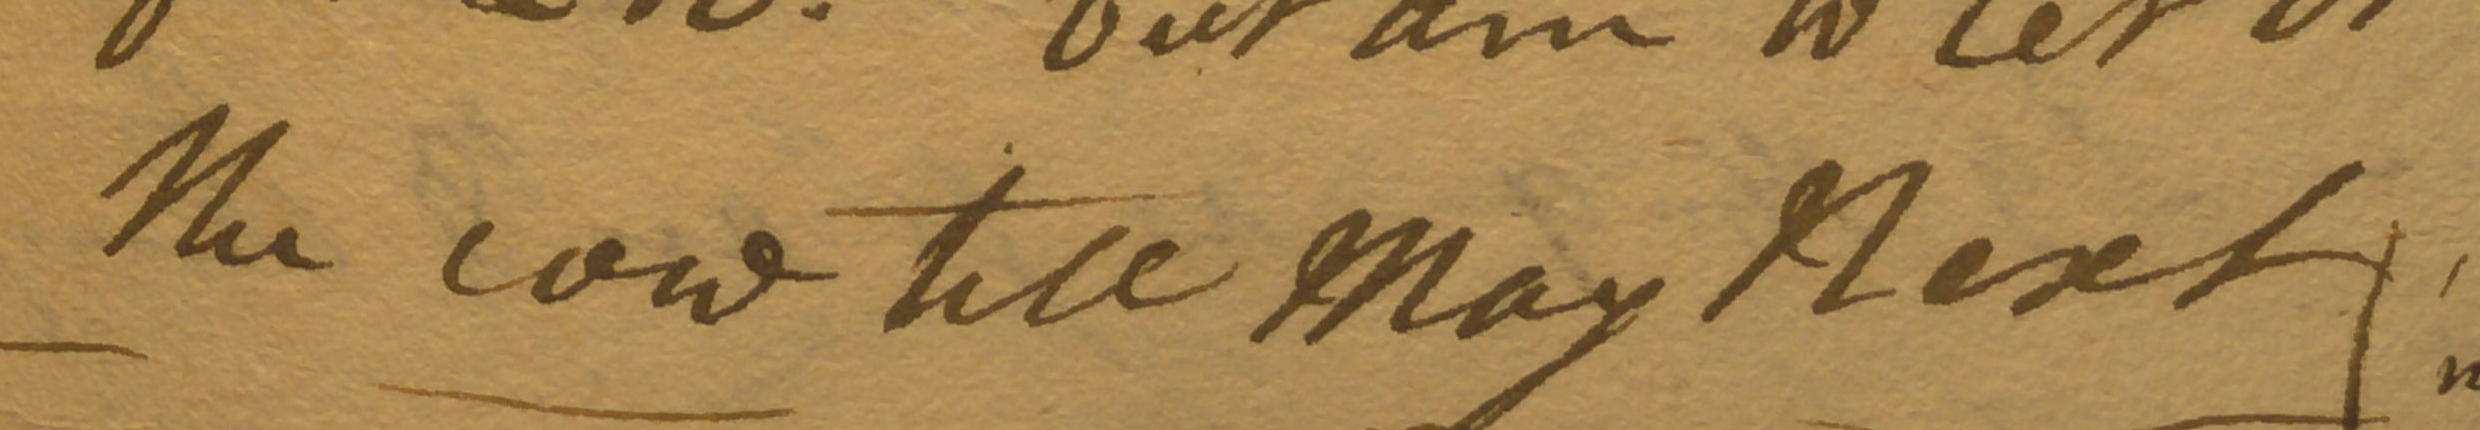the cow till May Next
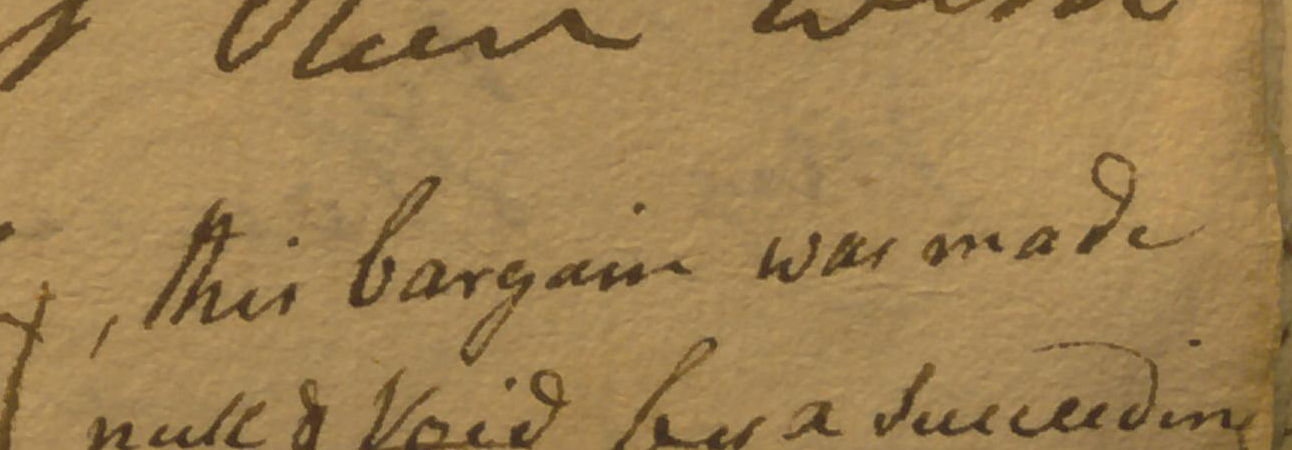this bargain was made
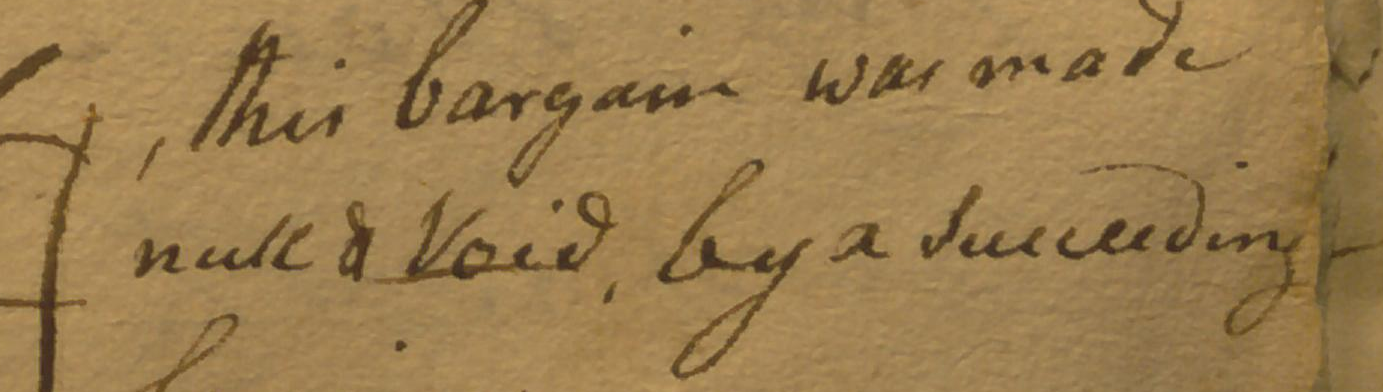null & Void by a succeeding
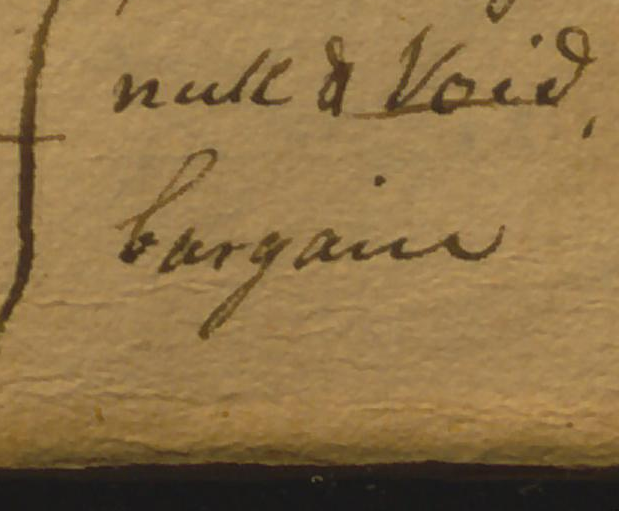bargain
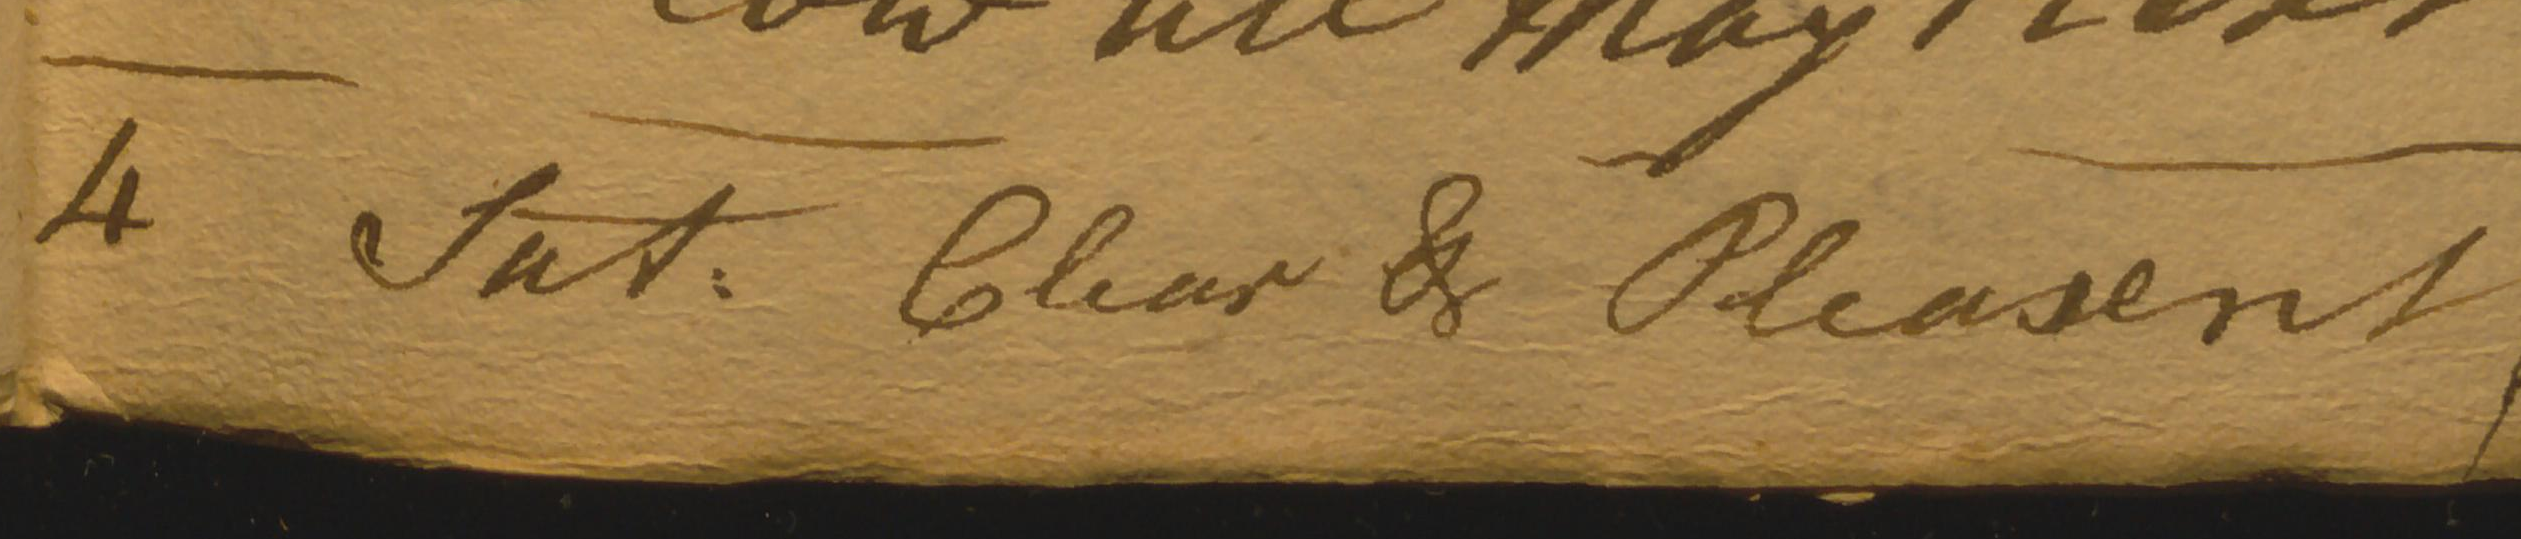Sat. Clear & Pleasent
